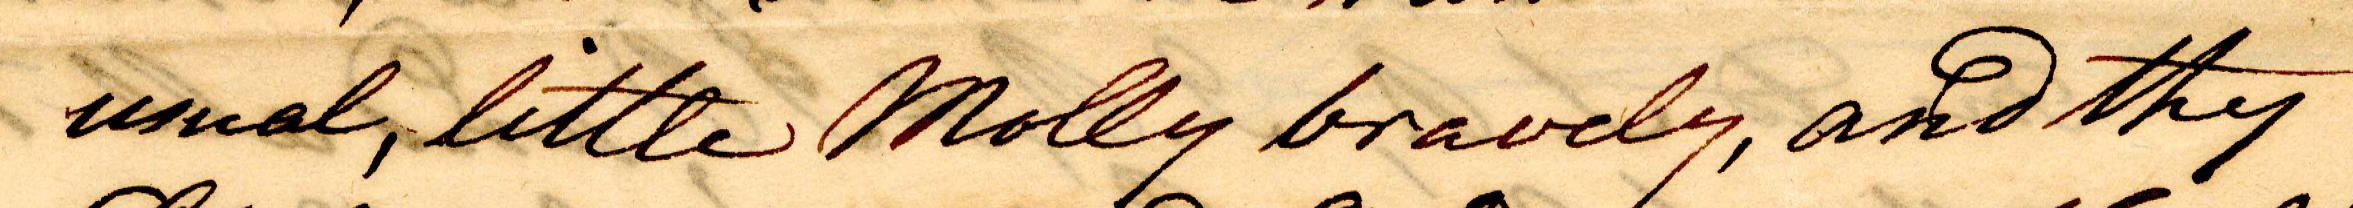usual, little Molly bravely, and thy
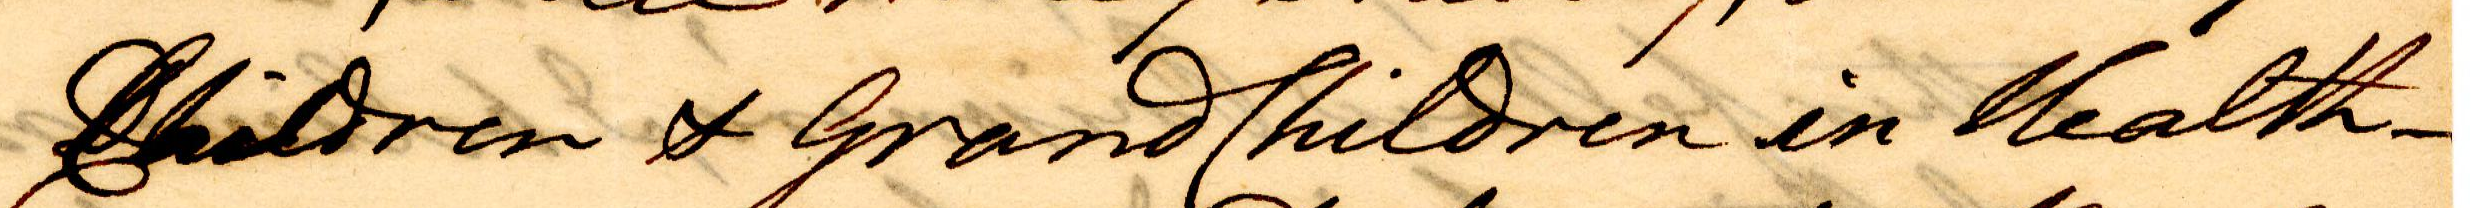Children & Grand Children in Health-
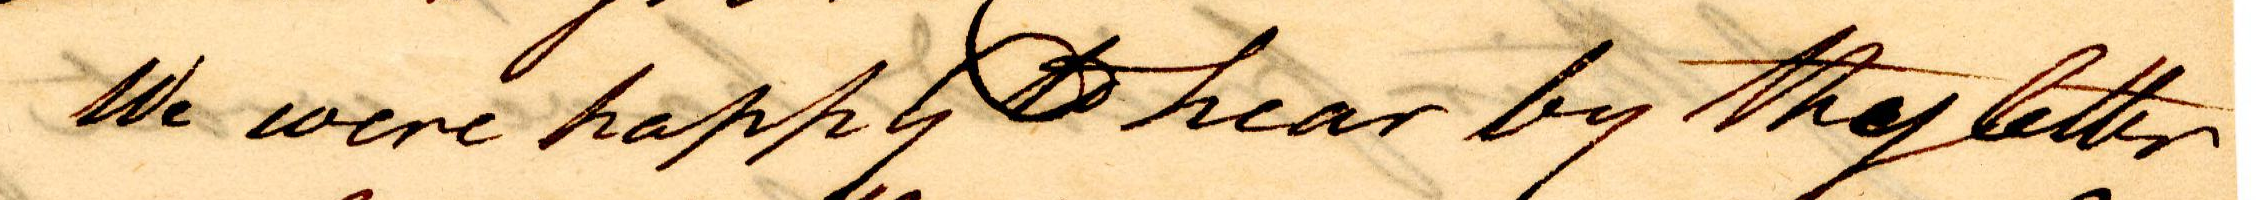We were happy to hear by thy letter
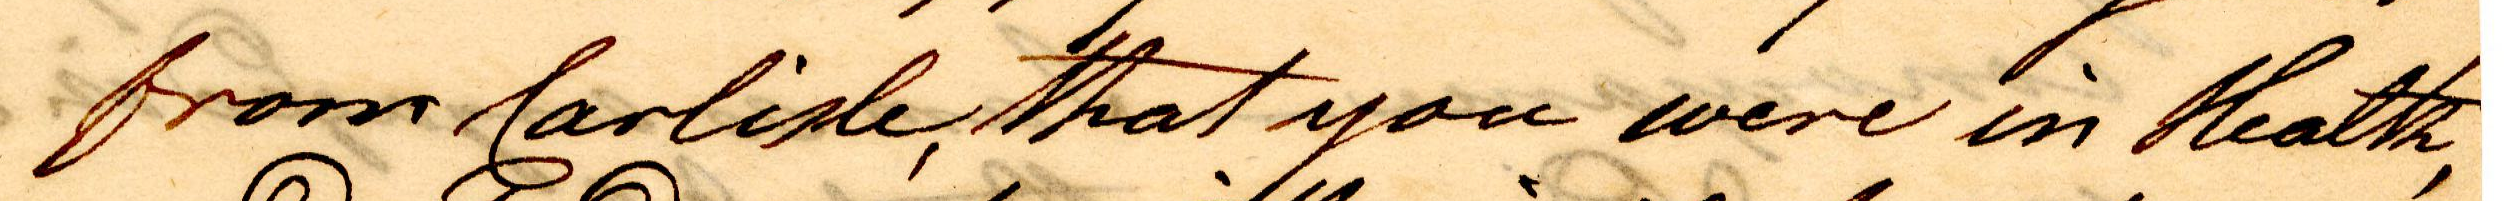from Carlisle, that you were in Health,
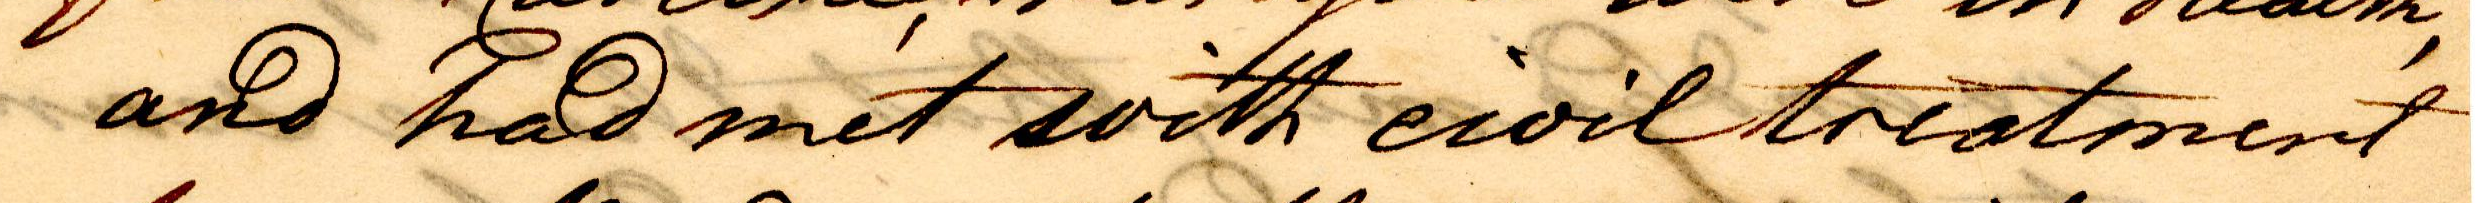and had met with civil treatment
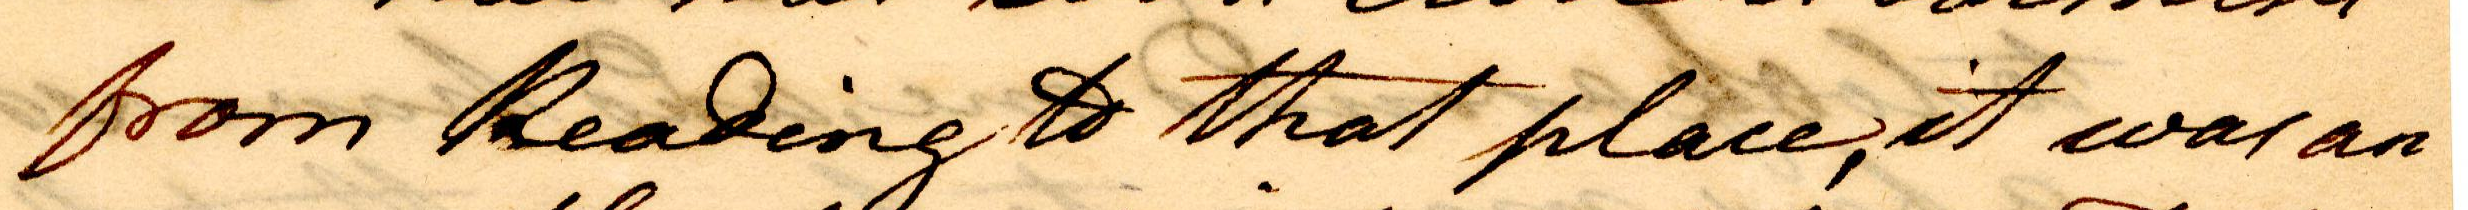from Reading to that place, it was an
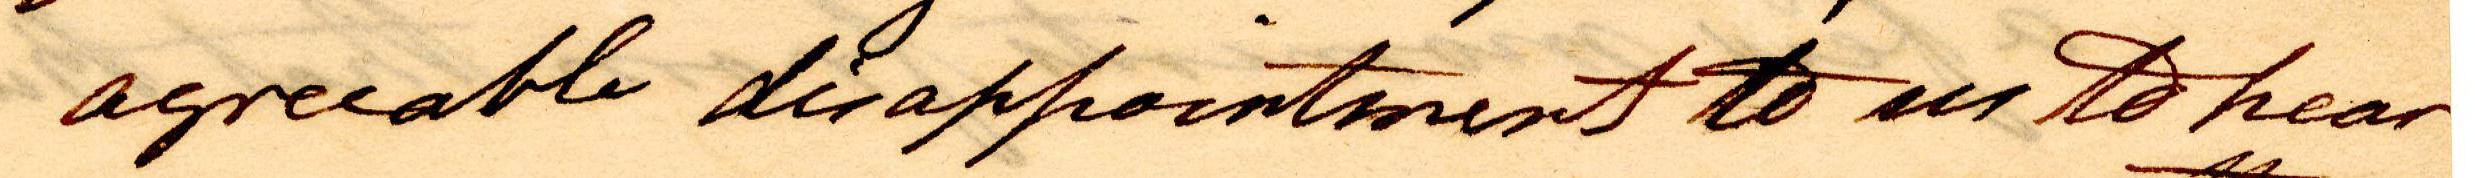agreeable disappointment to us to hear
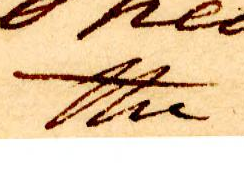the
